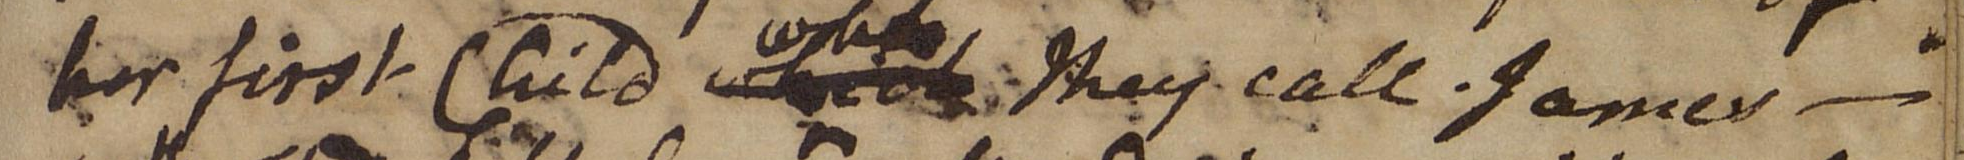her first Child [which] they call James-
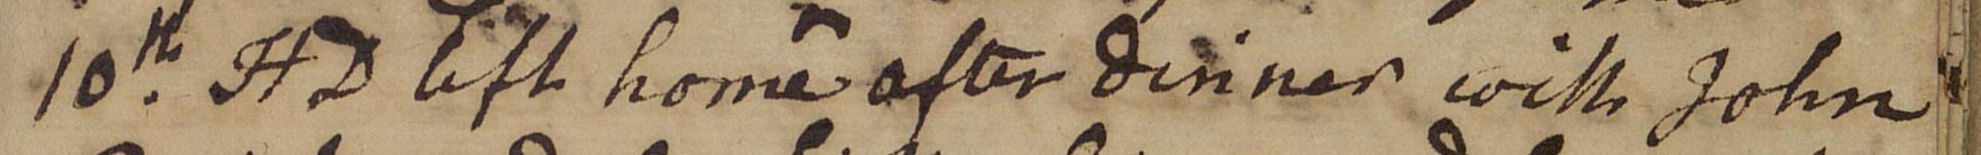10^th. HD lift home after dinner with John
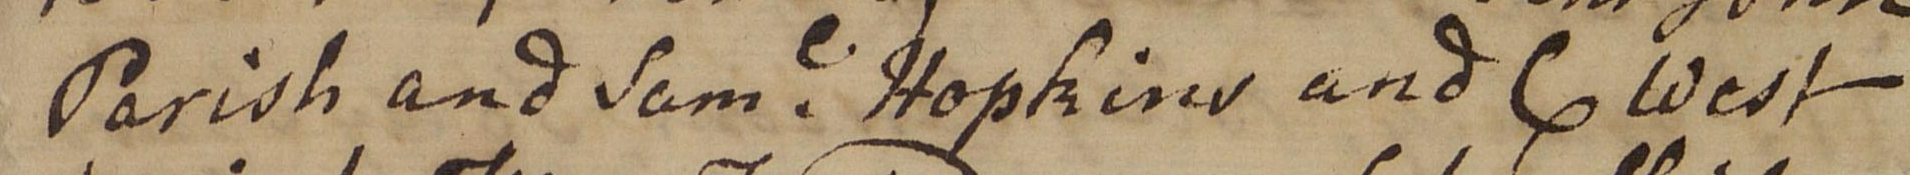Parish and Sam.^l Hopkins and C West
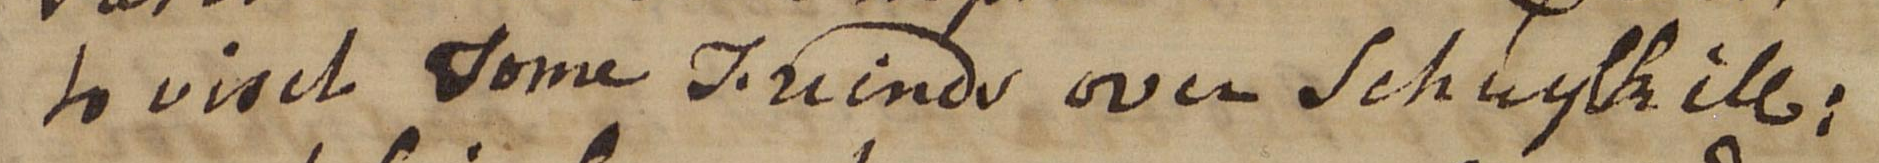to visit some Freinds over Schuylkill:
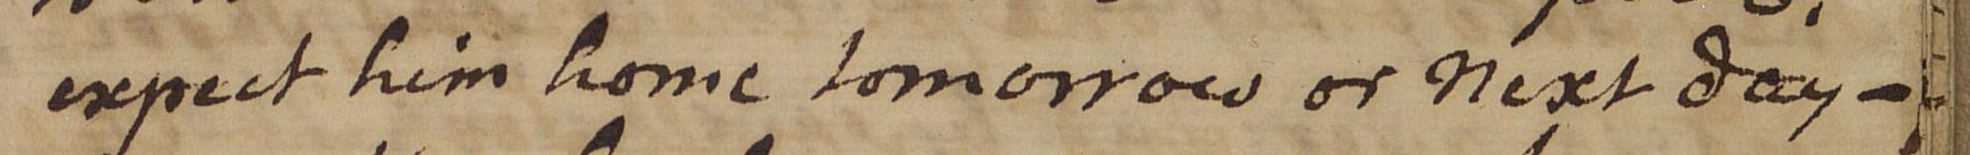expect him home tomorrow or Next day-
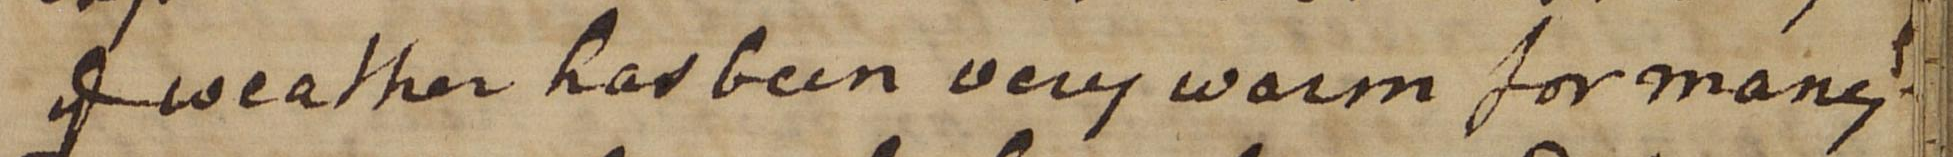y^e weather has been very warm for many
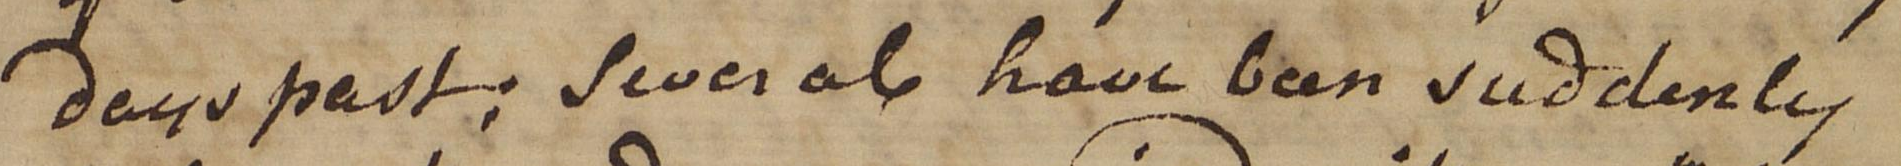days past; several have been suddenly
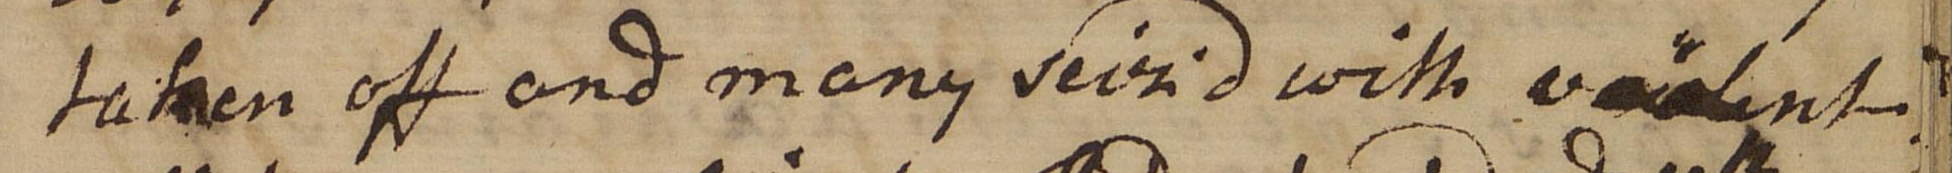taken off and many seiz'd with v[o]iolent
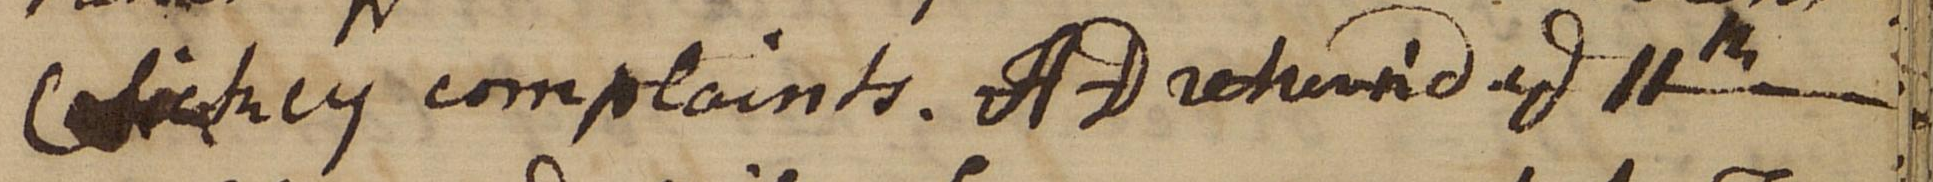C[o]lickey complaints. HD rerurn'd y^e 11^th-
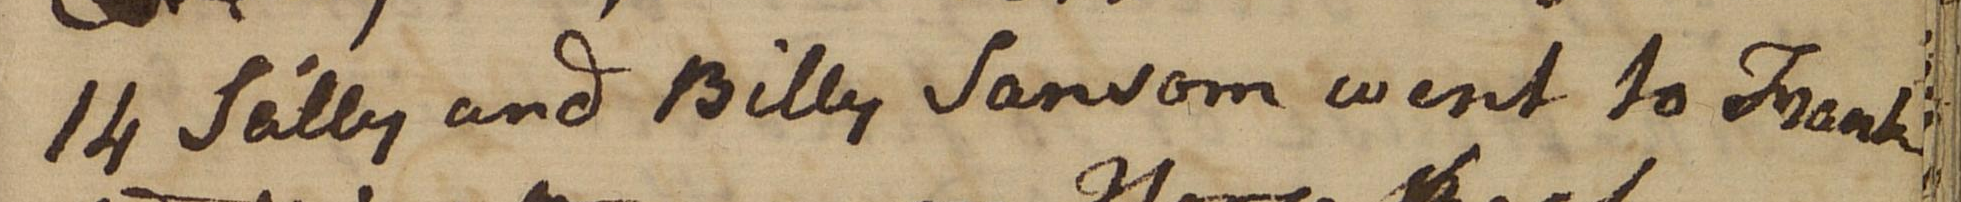14 Sally and Billy Sansom went to Frank
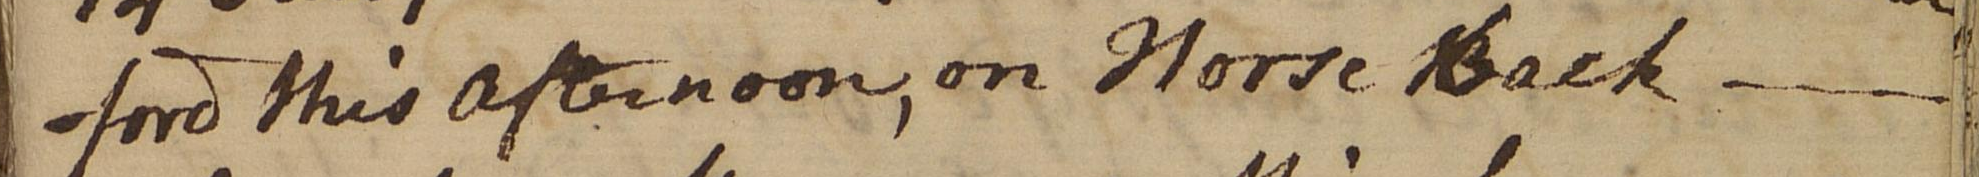-ford this afternoon, on Horse Back-
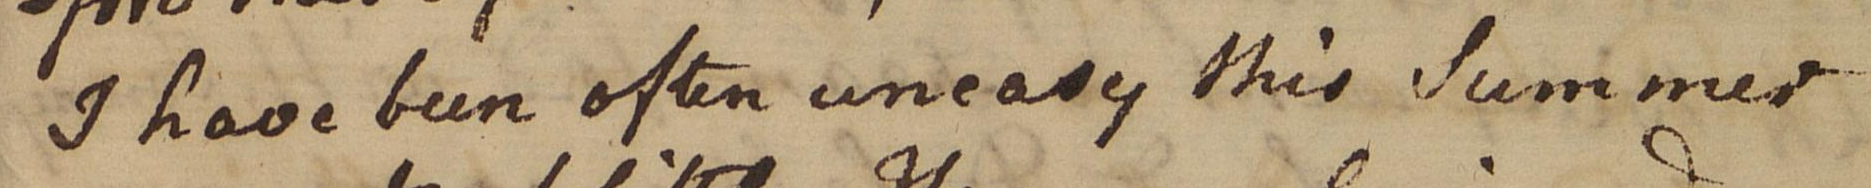I have been often uneasy this Summer
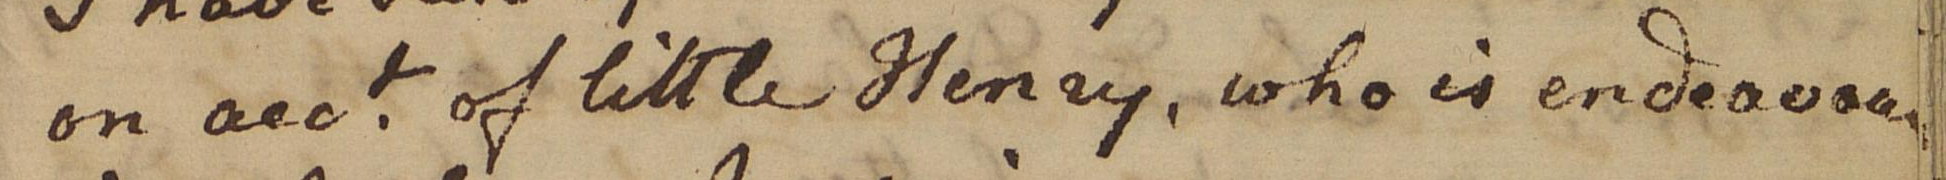on acc^t. of little Henry, who is endeavour
